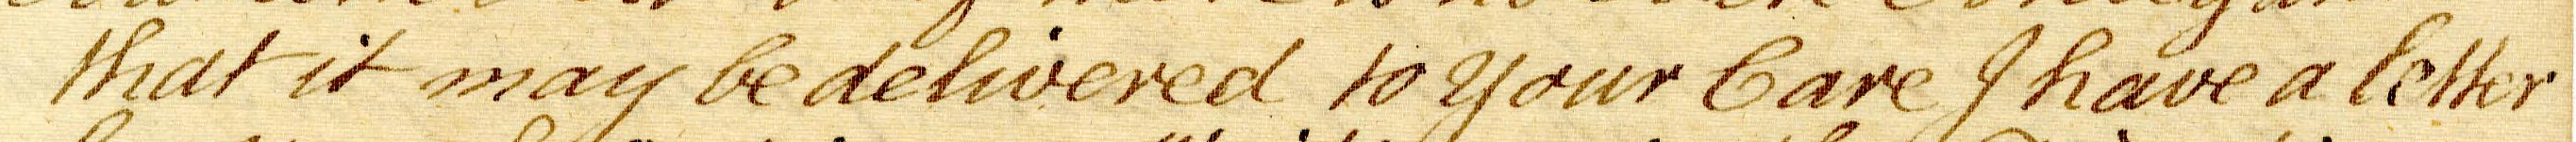that it may be delivered to your Care I have a letter
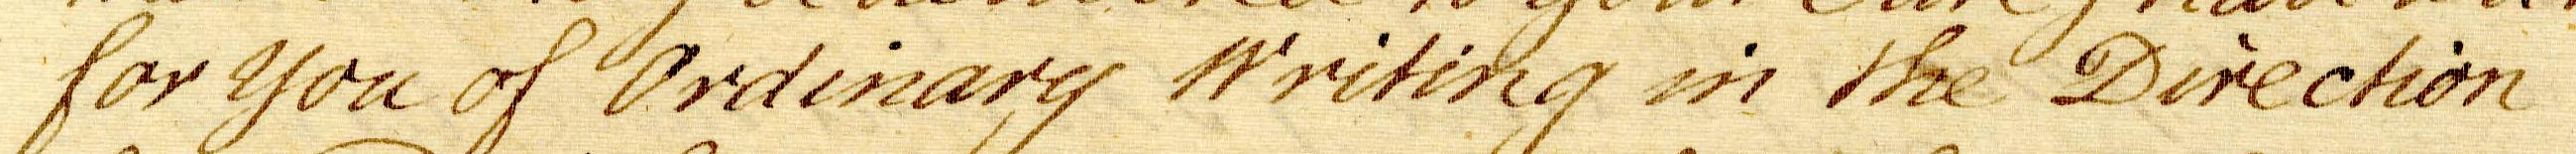for You of Ordinary Writing in the Direction
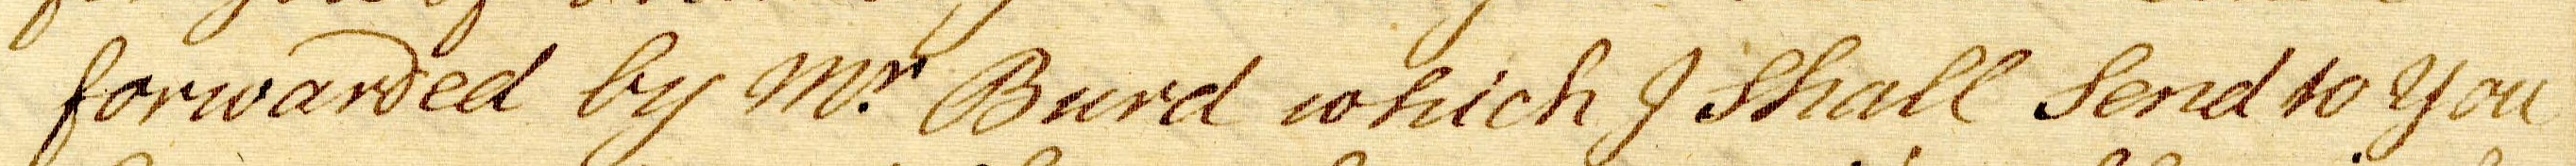forwarded by M^r. Burd which I Shall Send to You
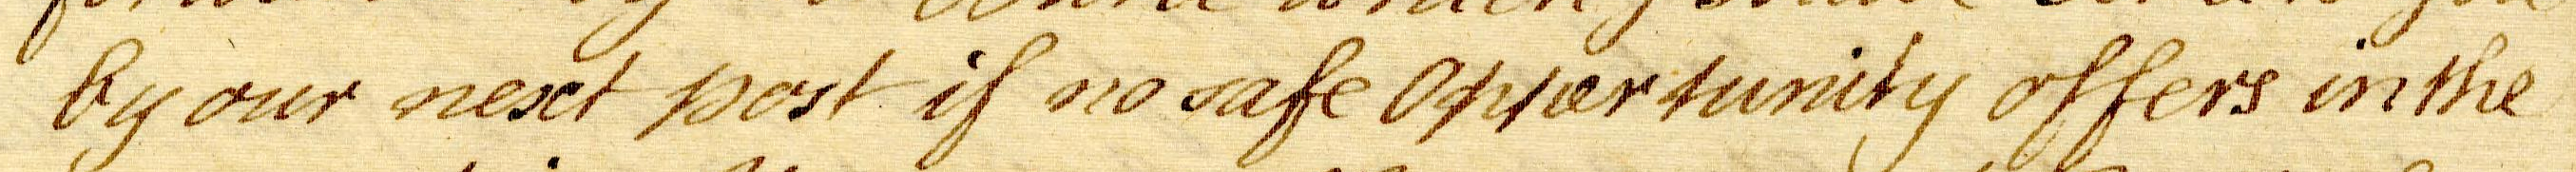by our next post if no safe Oppertunity offers in the
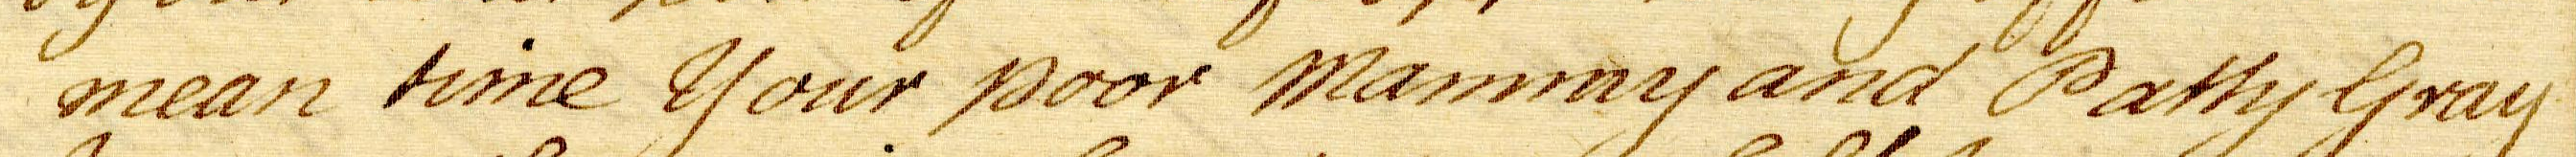mean time Your poor Mammy and Patty Gray
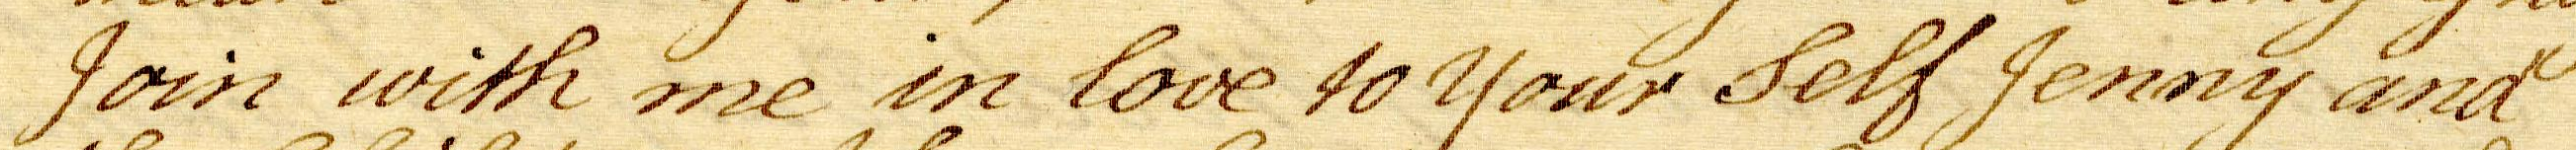Join with me in love to your Self Jenny and
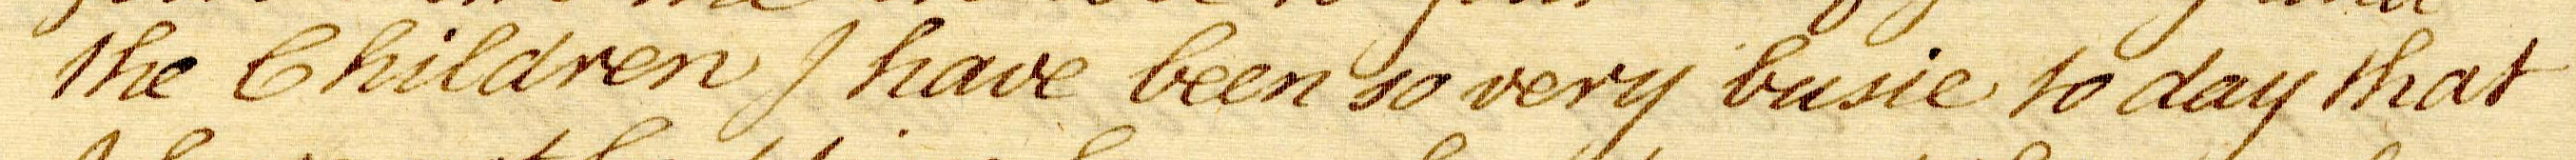the Children I have been so very busie to day that
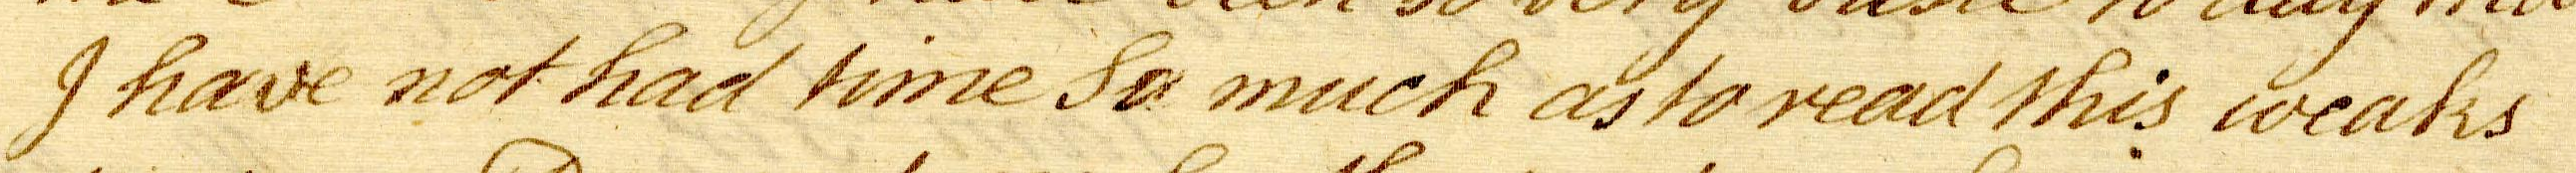I have not had time So much as to read this weaks
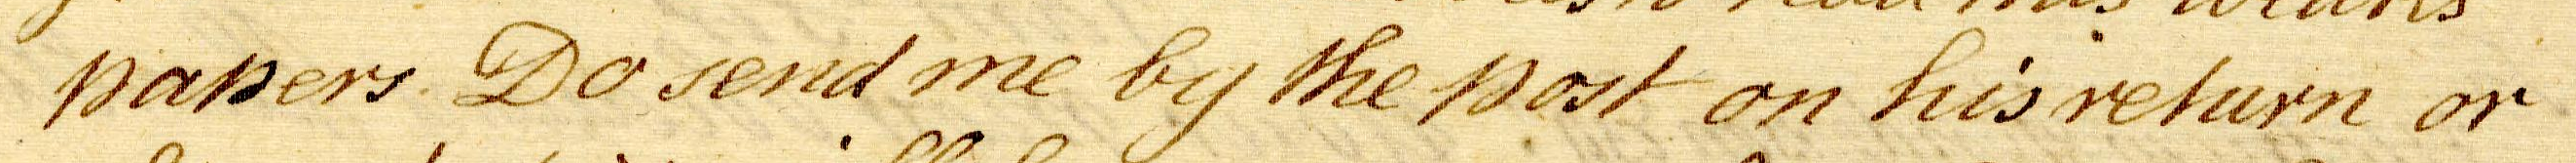papers Do send Me by the post on his return or
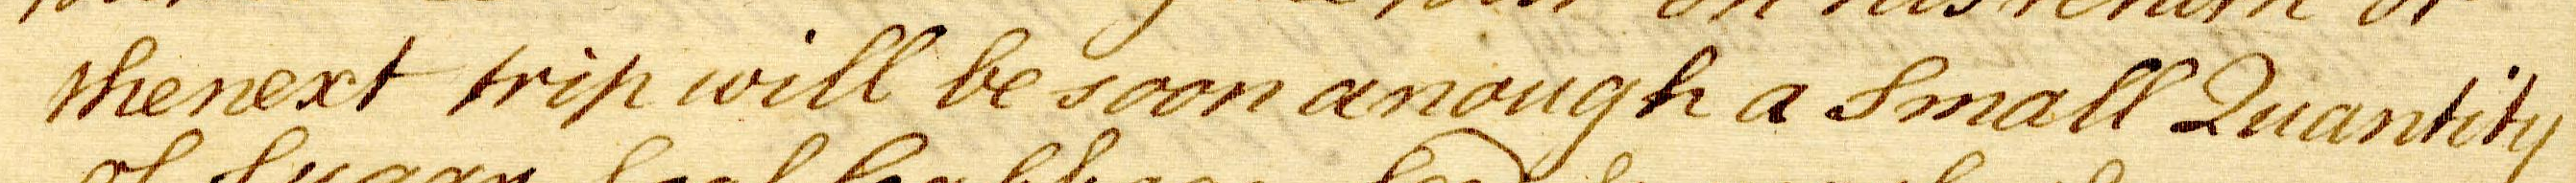the next trip will be soon anough a Small Quantity
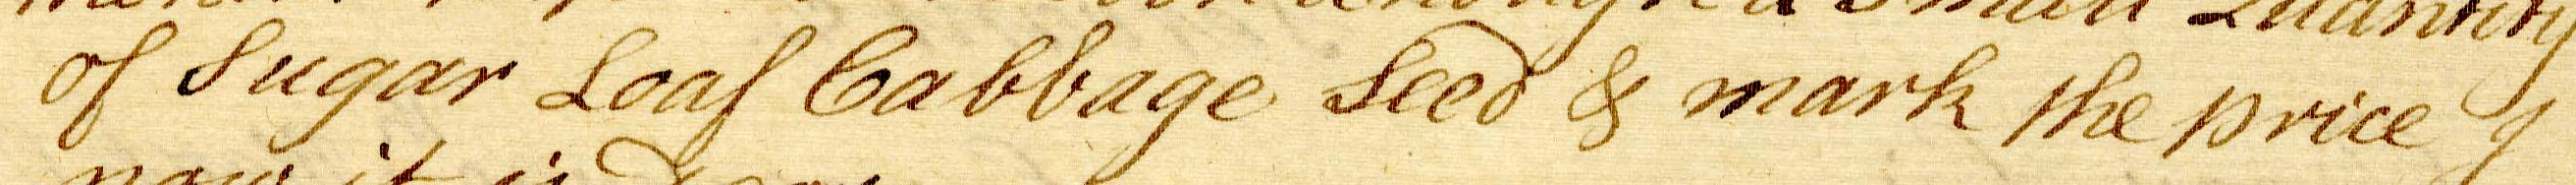of Sugar Loaf Cabbage Seed & mark the price I
